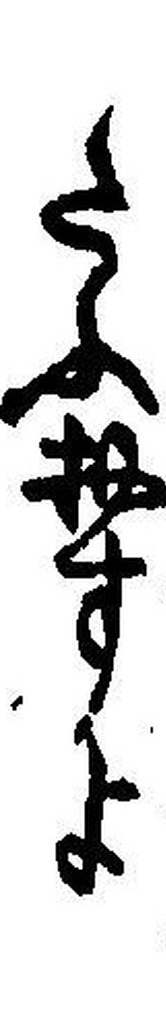たふおすよ
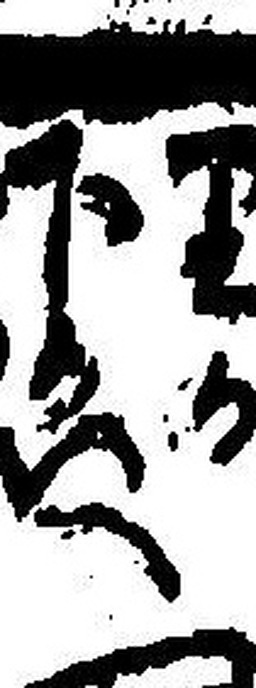下かいへ
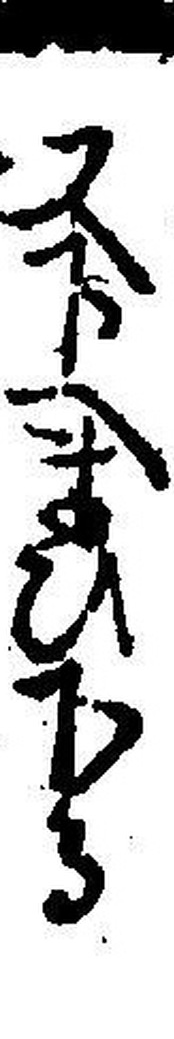又下へまひ下る
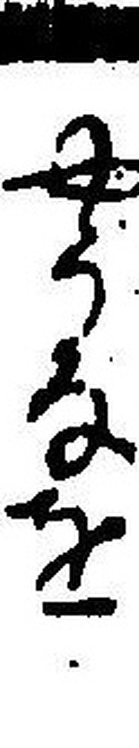やうなを
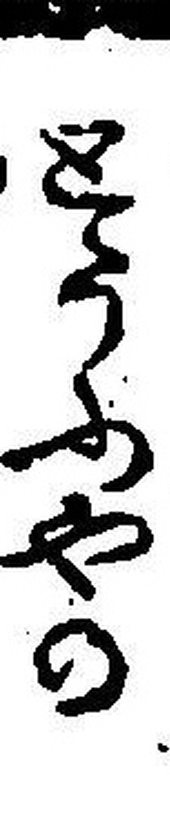とうふやの
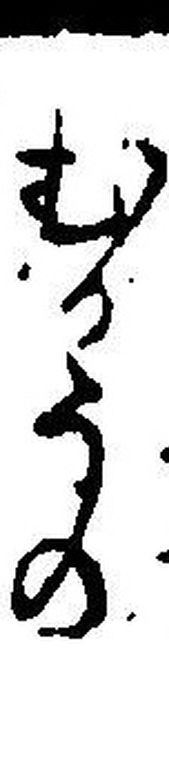むかうの
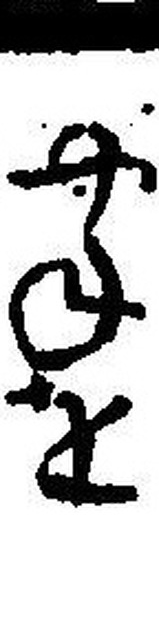やねを
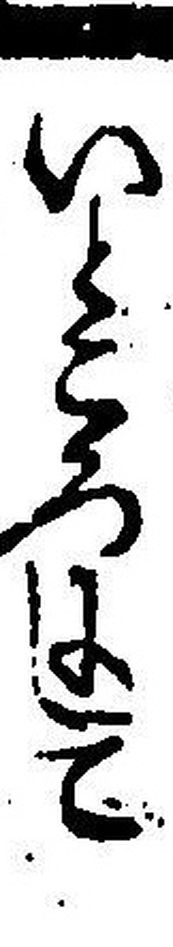いところにして
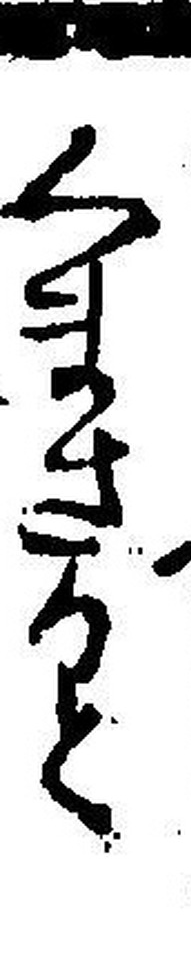くまさかと
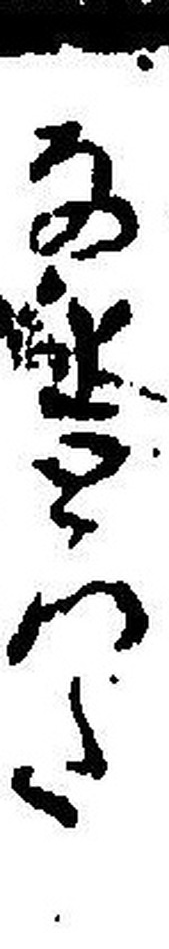なをとつた
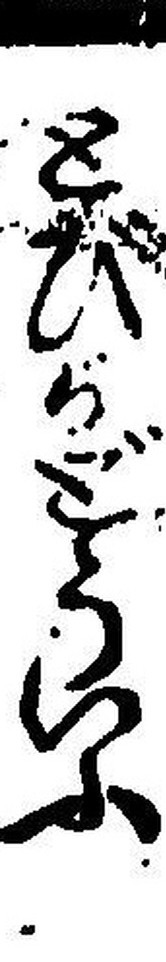とびがどういふ
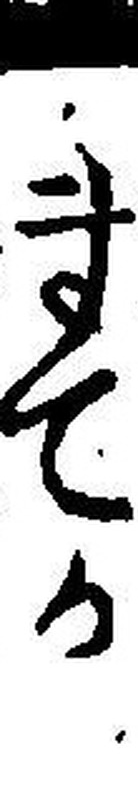まてか
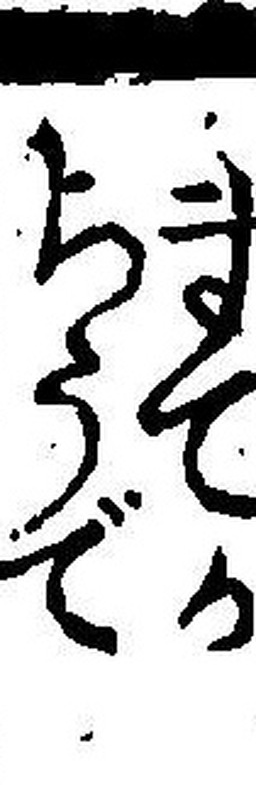ちうで
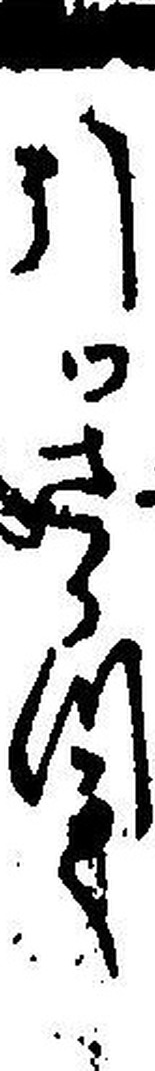引ッさらつて
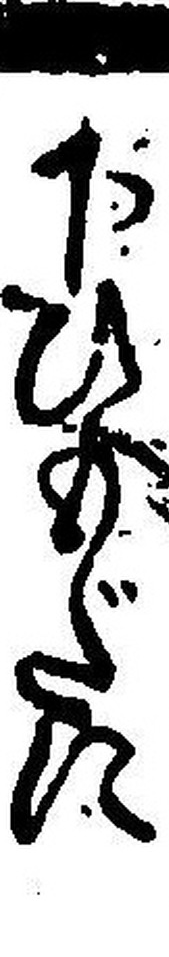下ひもだに
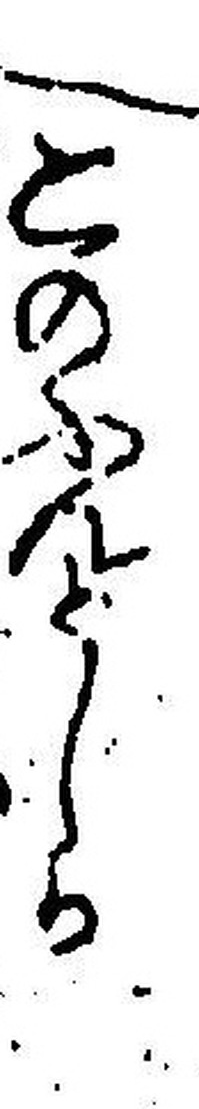このふんとしか
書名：徳若水縁起金性 / 樹下石上作
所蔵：東京大学総合図書館 General Library in the University of Tokyo, JAPAN
